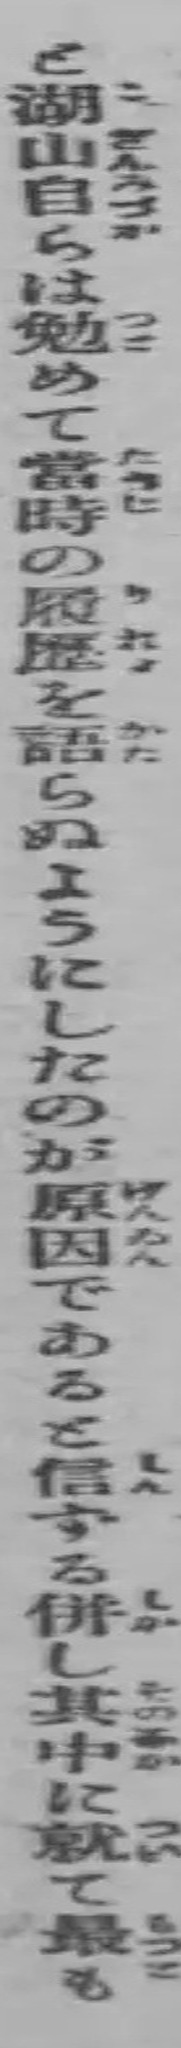と湖山自らは勉めて当時の履歴を語らぬようにしたのが原因であると信ずる併し其中に就て最も
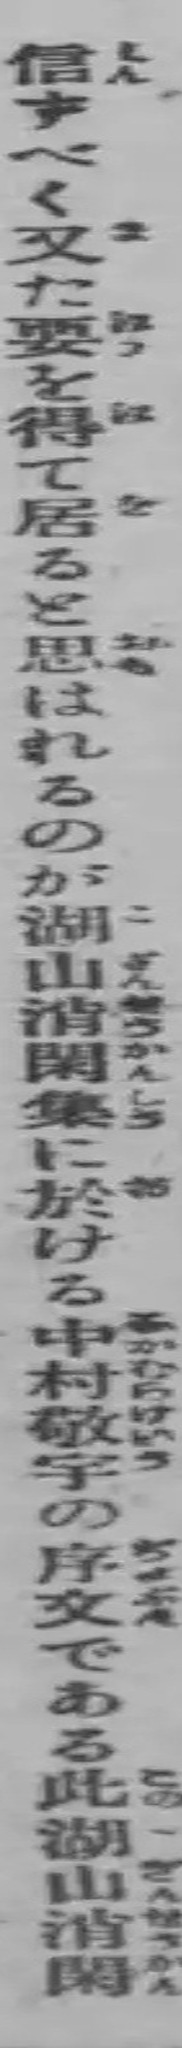信ずべく又た要を得て居ると思はれるのが湖山消閑集に於ける中村敬宇の序文である此湖山消閑
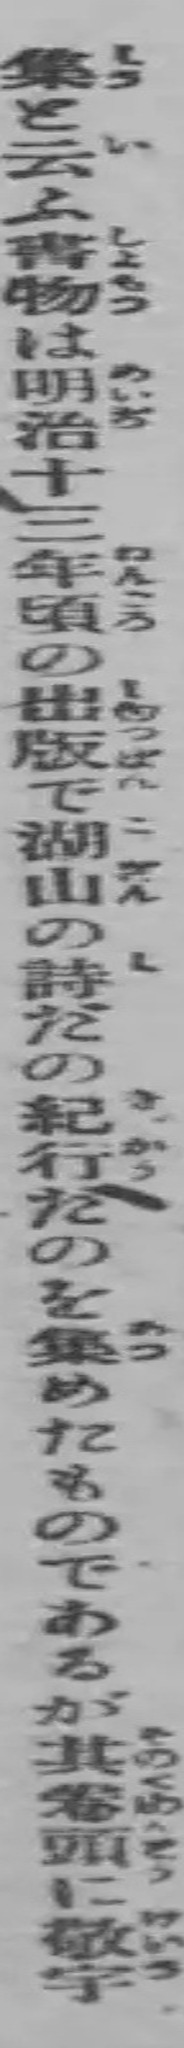集と云ふ書物は明治十三年頃の出版で湖山の詩だの紀行だのを集めたものであるが其巻頭に敬宇
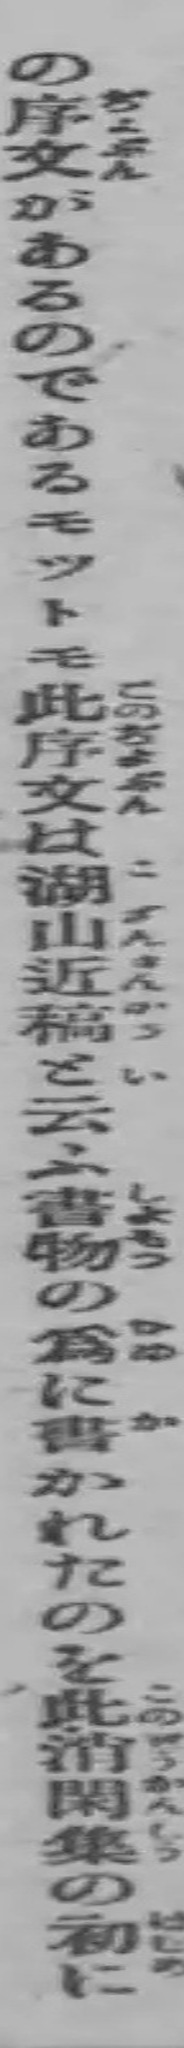の序文があるのであるモツトモ此序文は湖山近稿と云ふ書物の為に書かれたのを此消閑集の初に
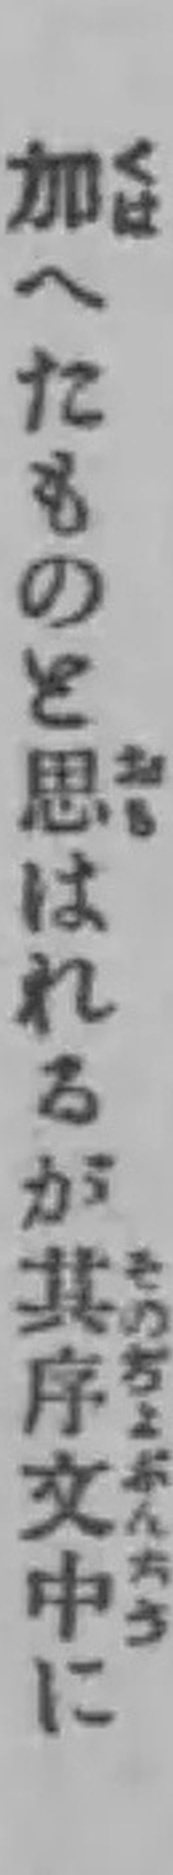加へたものと思はれるが其序文中に
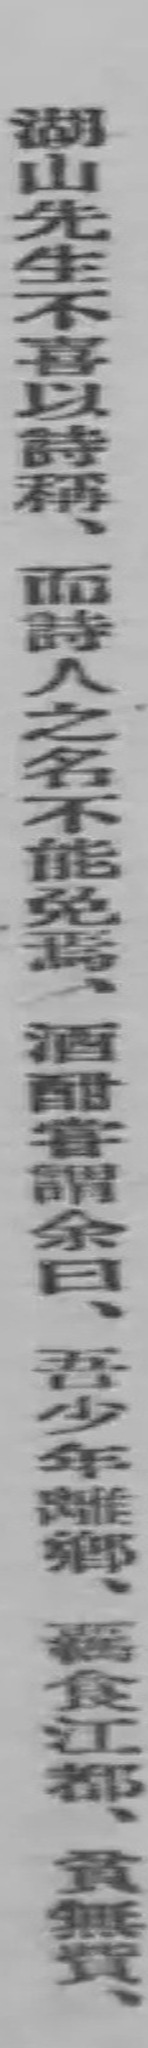湖山先生不喜以詩称、而詩人之名不能免焉、酒酣嘗謂余曰、吾少年離郷、覊食江都、貧無貲、
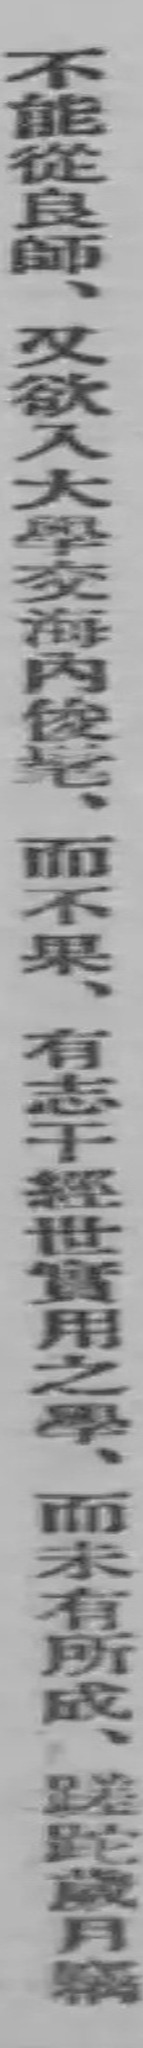不能従良師、又欲入大学交海内俊髦、而不果、有志干経世実用之学、而未有所成、蹉跎歳月竊
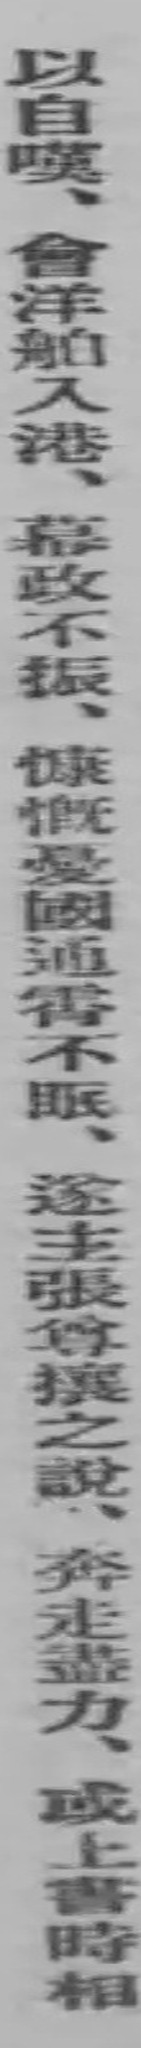以自嘆、会洋舶入港、幕政不振、慷慨憂国通霄不眠、遂主張尊攘之説、奔走尽力、或上書時相
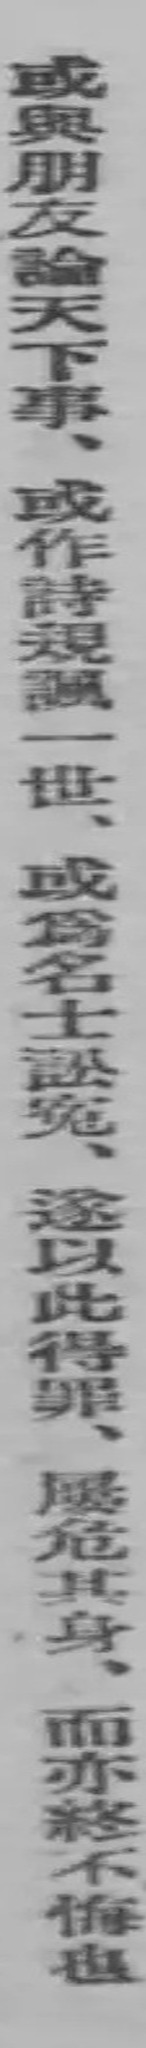或与朋友論天下事、或作詩規諷一世、或為名士訟冤、遂以此得罪、屢危其身、而亦終不悔也
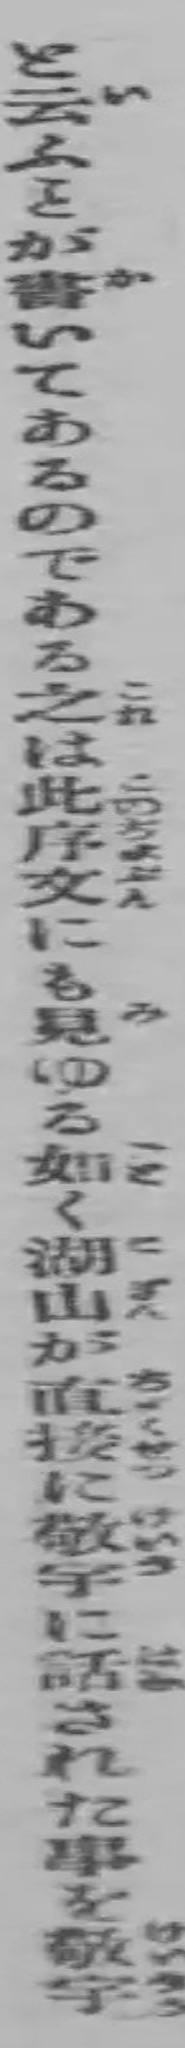と云ふことが書いてあるのである之は此序文にも見ゆる如く湖山が直接に敬宇に話された事を敬宇
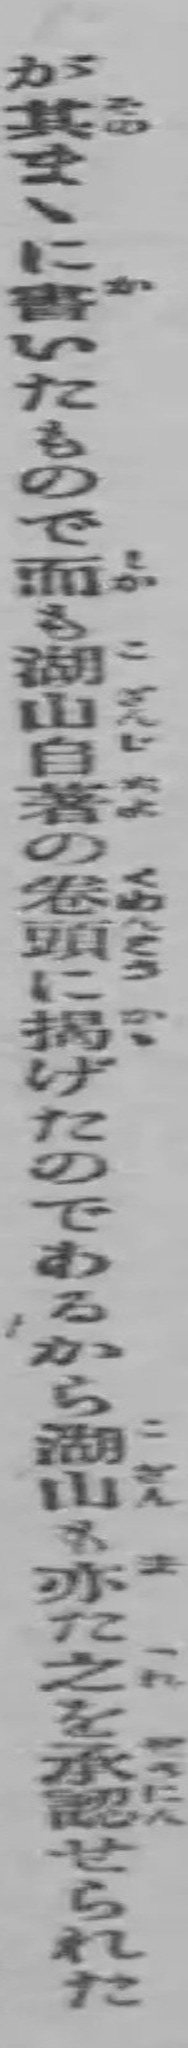が其まヽに書いたもので而も湖山自著の巻頭に掲げたのであるから湖山も亦た之を承認せられた
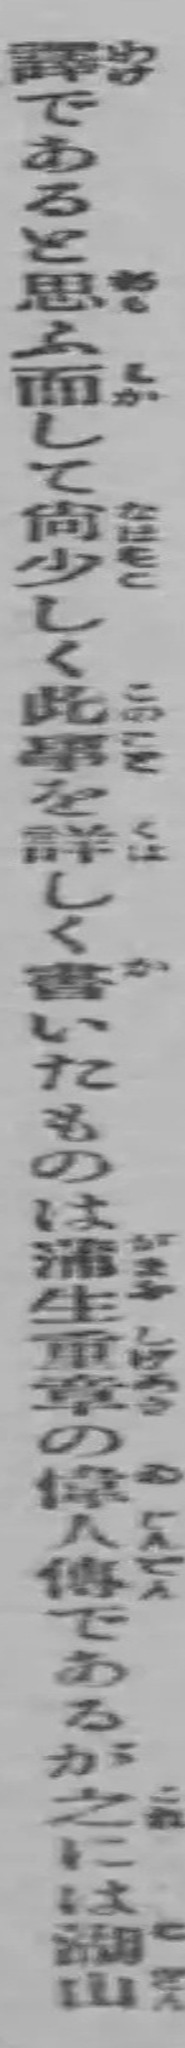訳であると思ふ而して尚少しく此事を詳しく書いたものは蒲生重章の偉人伝であるが之には湖山
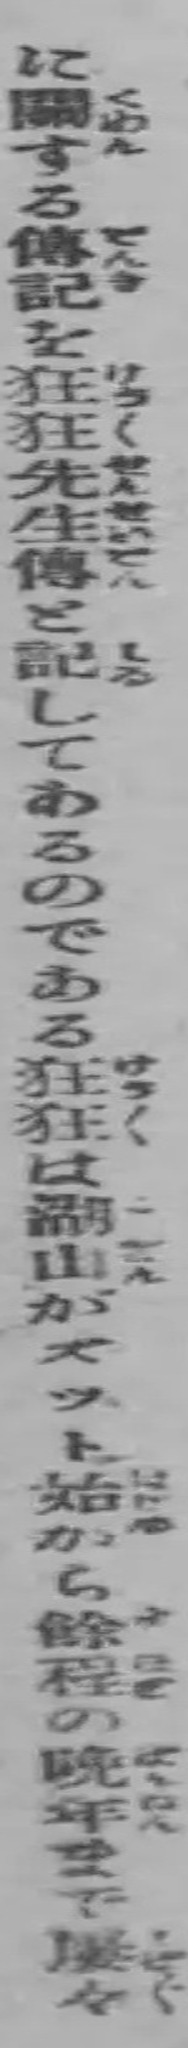に関する伝記を狂狂先生伝と記してあるのである狂狂は湖山がズツト始から余程の晩年まで屡々

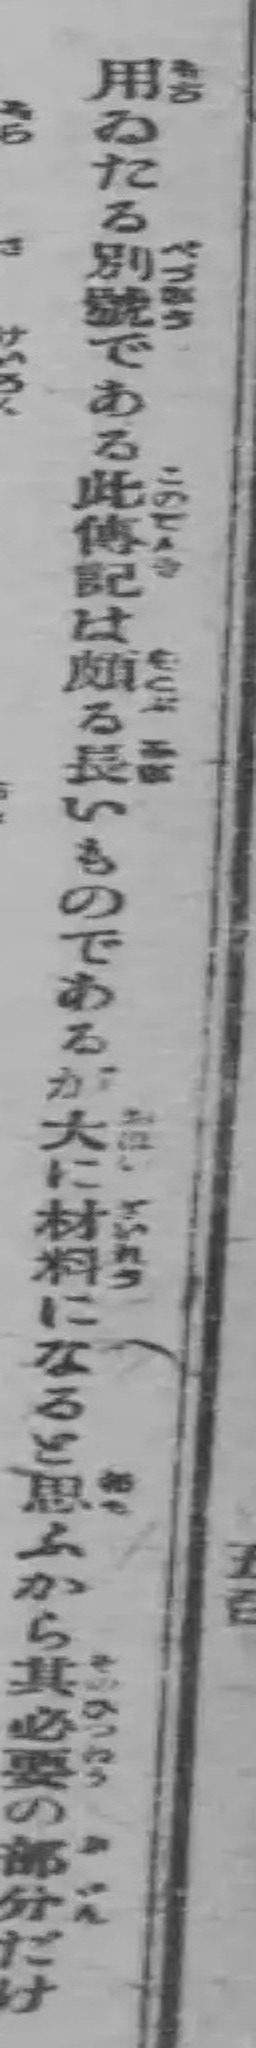用ゐたる別号である此伝記は頗る長いものであるが大に材料になると思ふから其必要の部分だけ
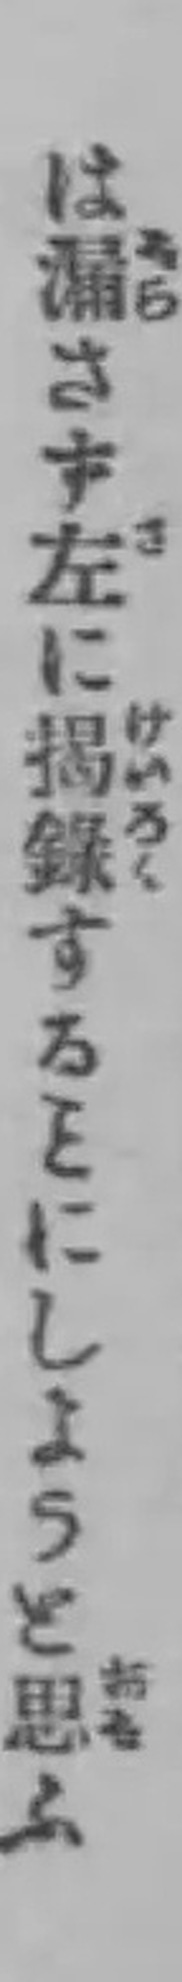は漏さず左に掲録することにしようと思ふ
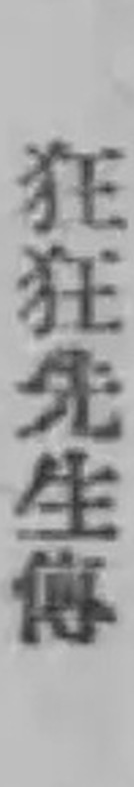狂狂先生伝
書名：豊橋市史談
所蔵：国立国会図書館 National Diet Library, JAPAN
